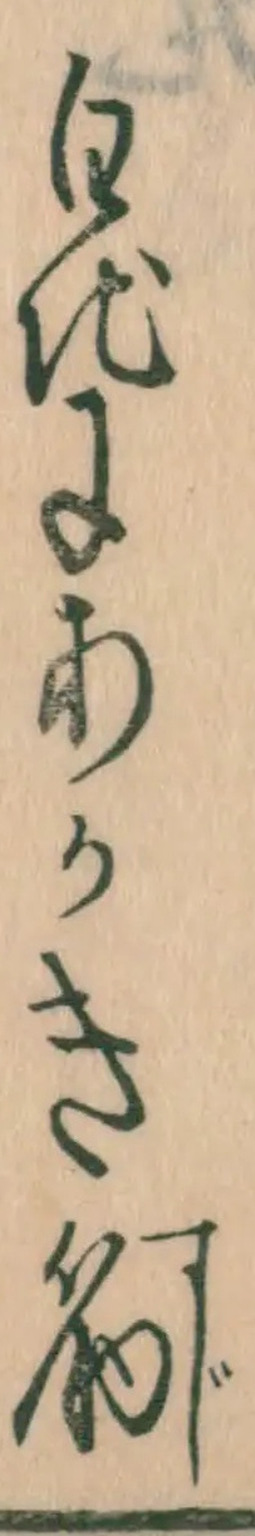白地にあかき筋
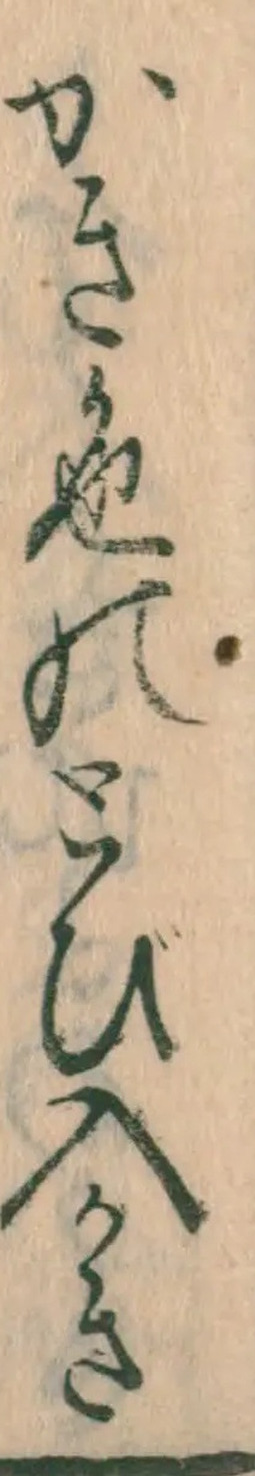かき色のとび入かき
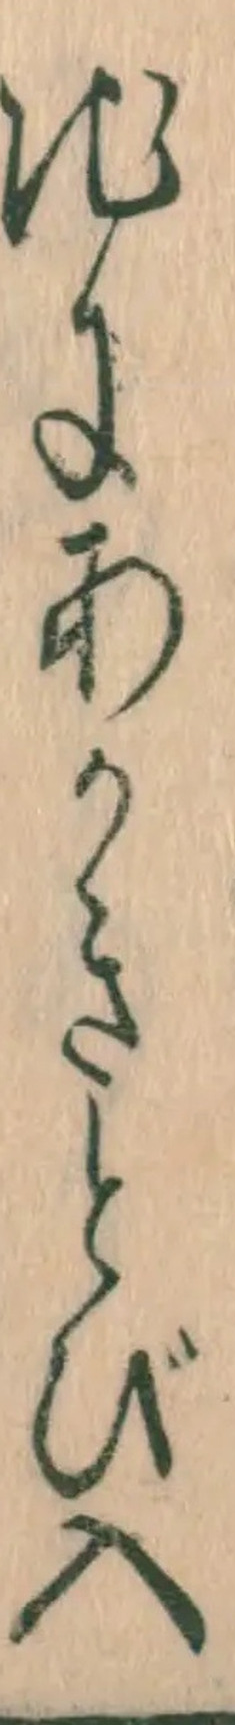地にあかきとび入
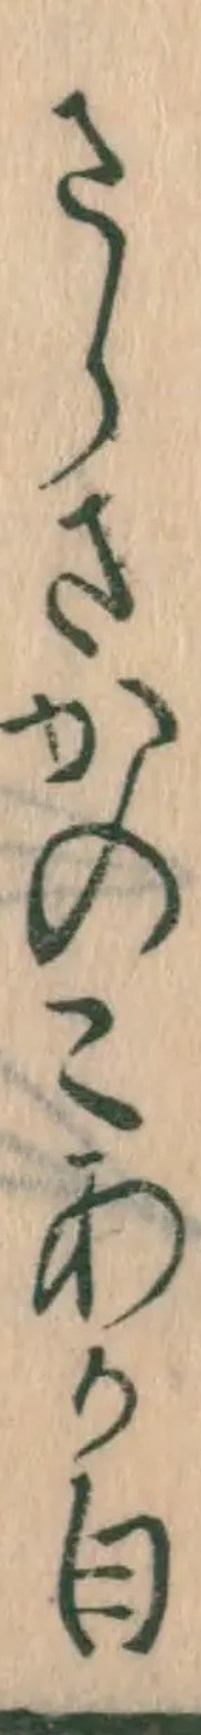さらさかのこあか白
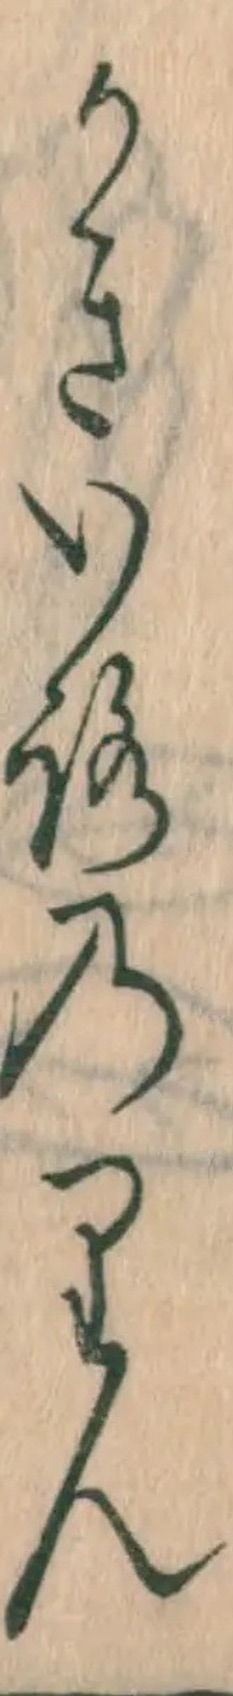かきいろのりん
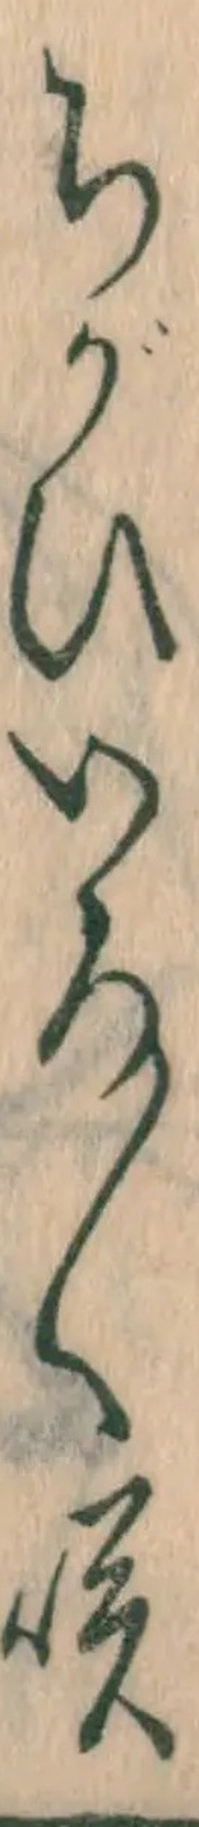ちがひいろ〳〵咲
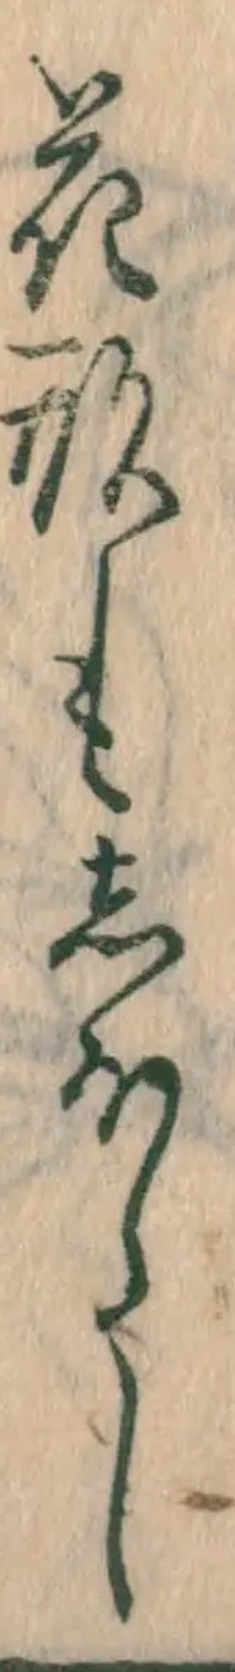花形もしほらし
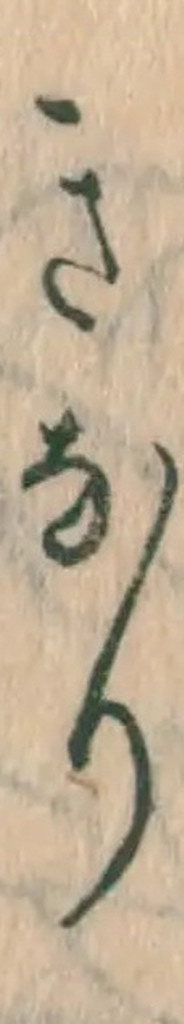きなり
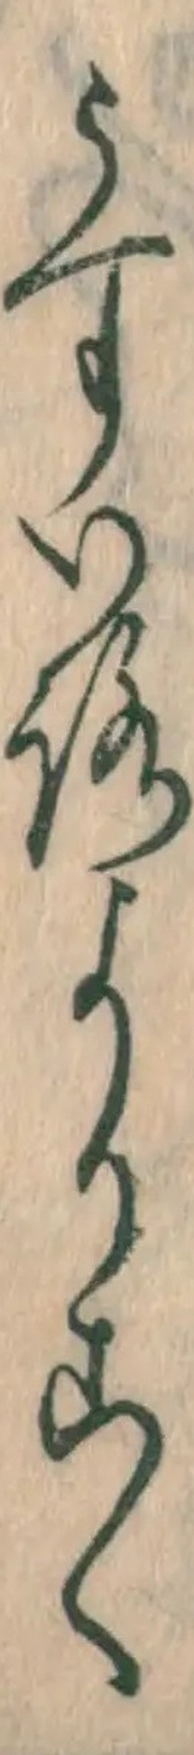うすいろよりこく
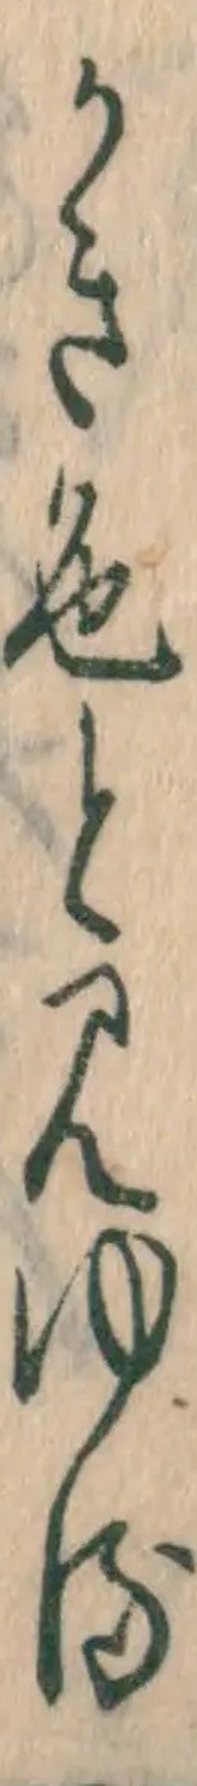かき色と見ゆる
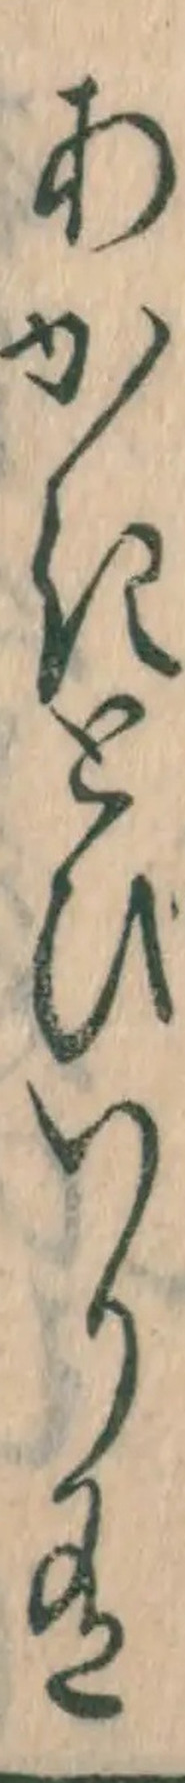あかきとびいり有

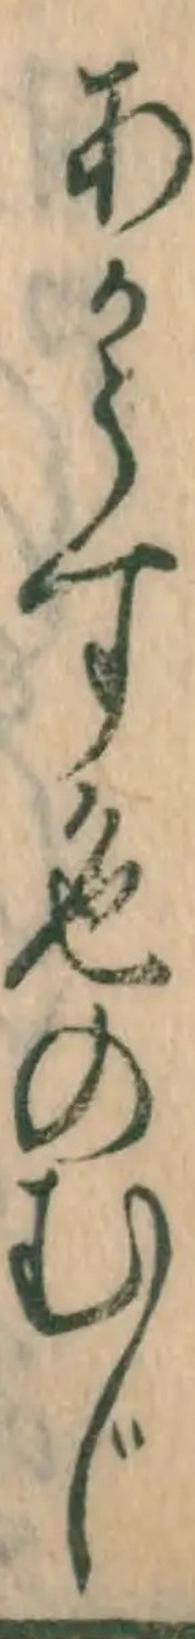あかうす色のむじ
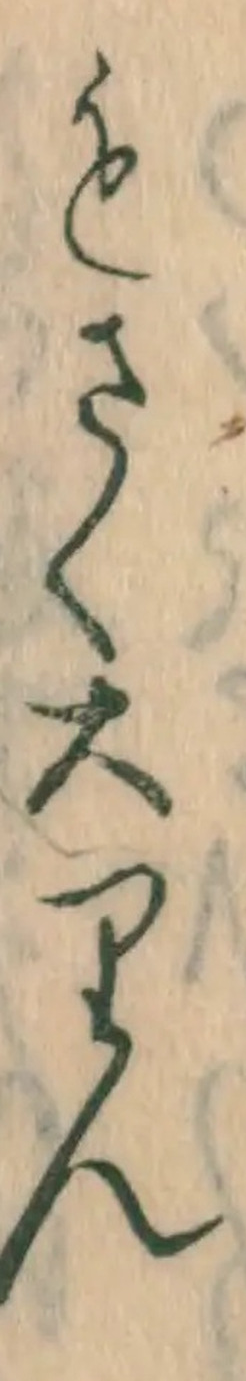もさく大りん
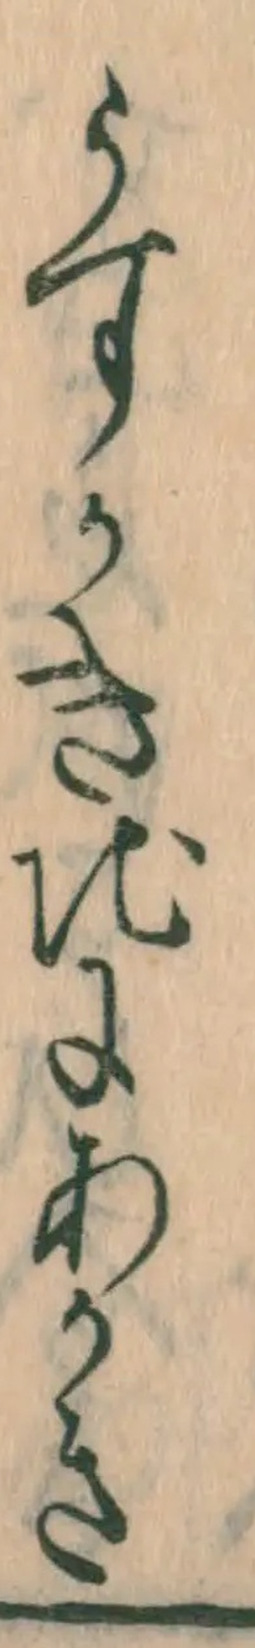うすかき地にあかき
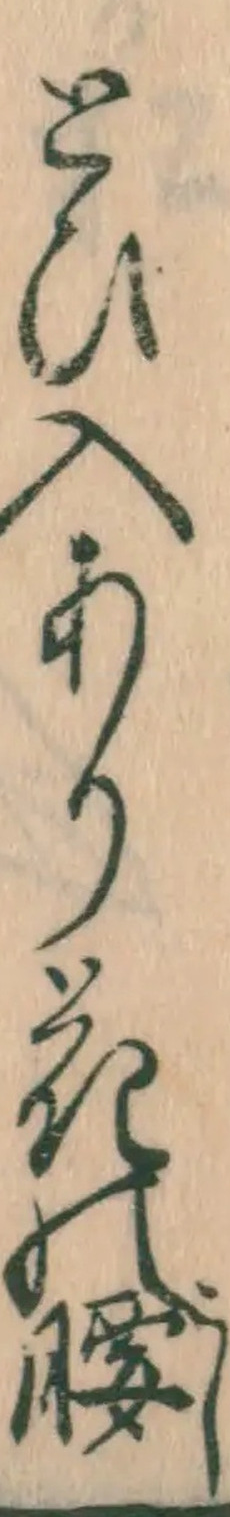とび入あり花の腰
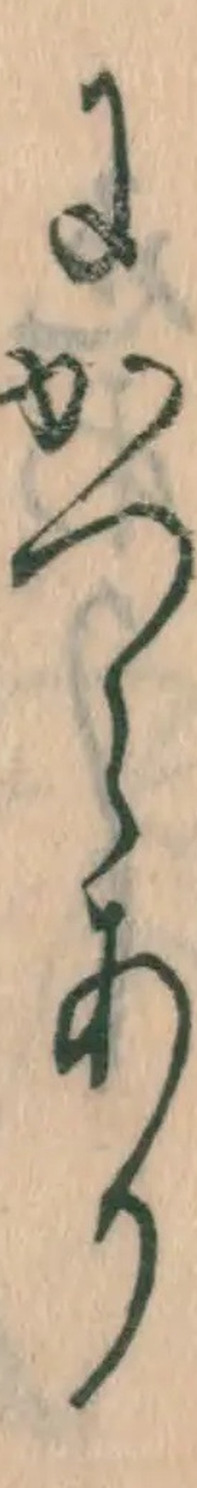にかつらあり
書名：錦繍枕 5巻. [5]
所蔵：国立国会図書館 National Diet Library, JAPAN
